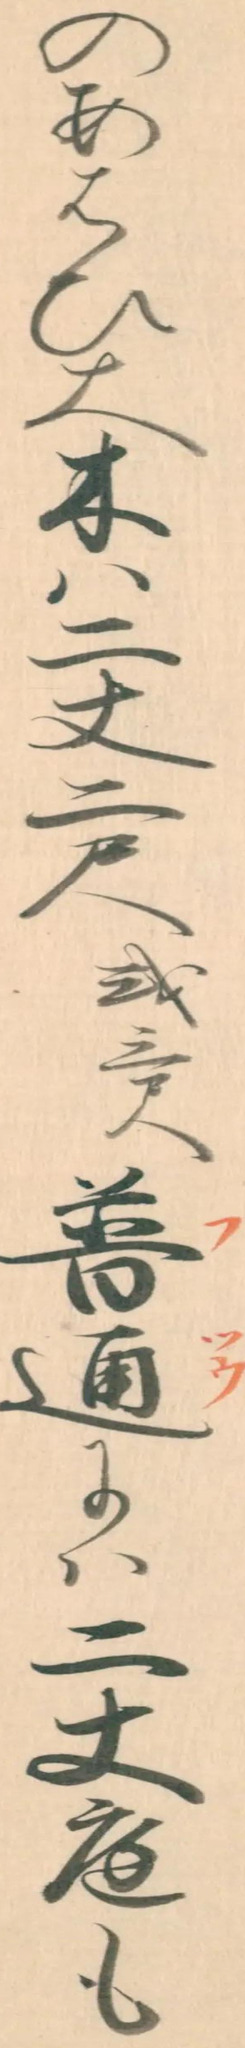のあはひ大木は二丈二尺或三尺普通には二尺庭も
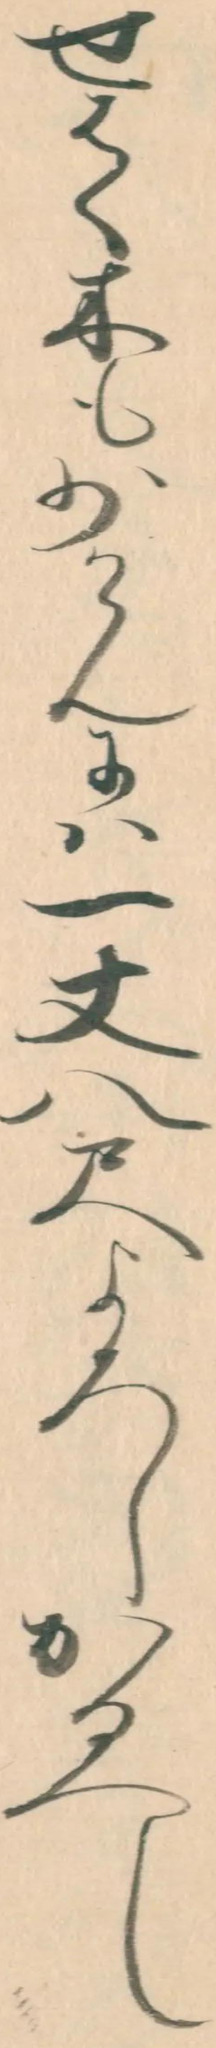せはく木も少からんには一丈八尺よろしかるへし
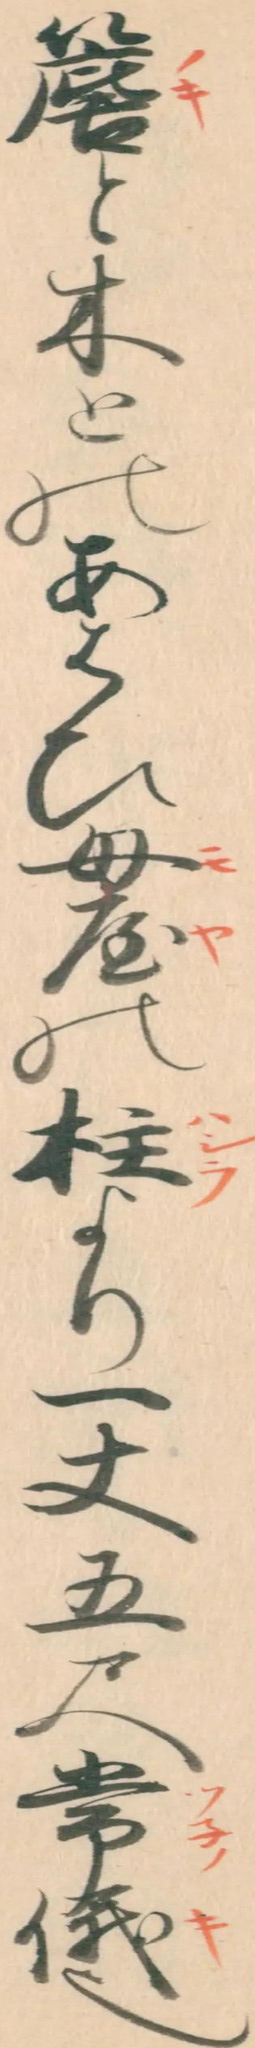簷と木とのあはひ母屋の柱より一丈五尺常儀也
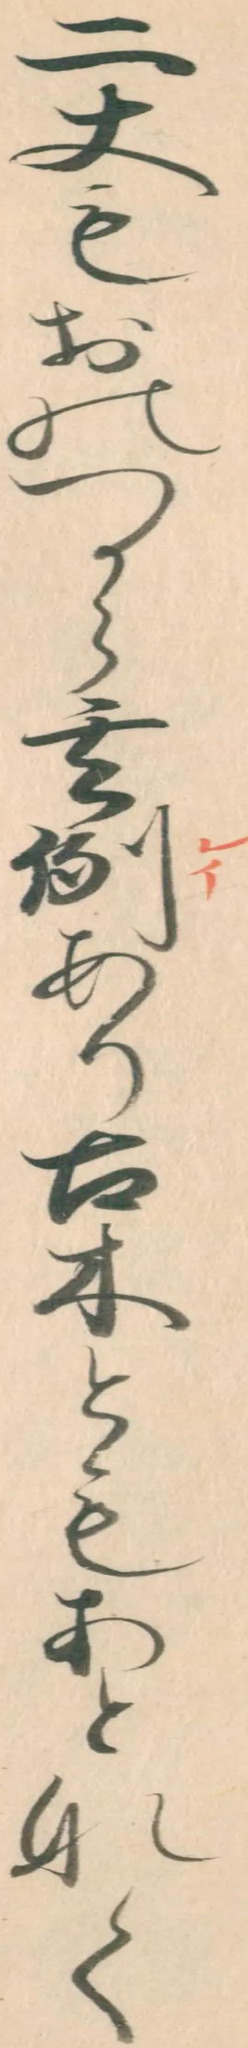二丈もおのつから其例あり古木ともあとなく
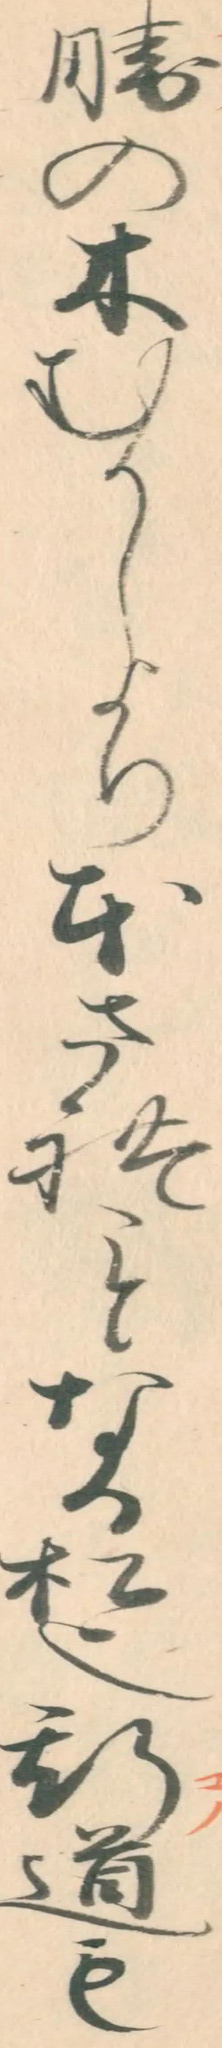勝の木むかしより本さゝれことなる松也斯道も

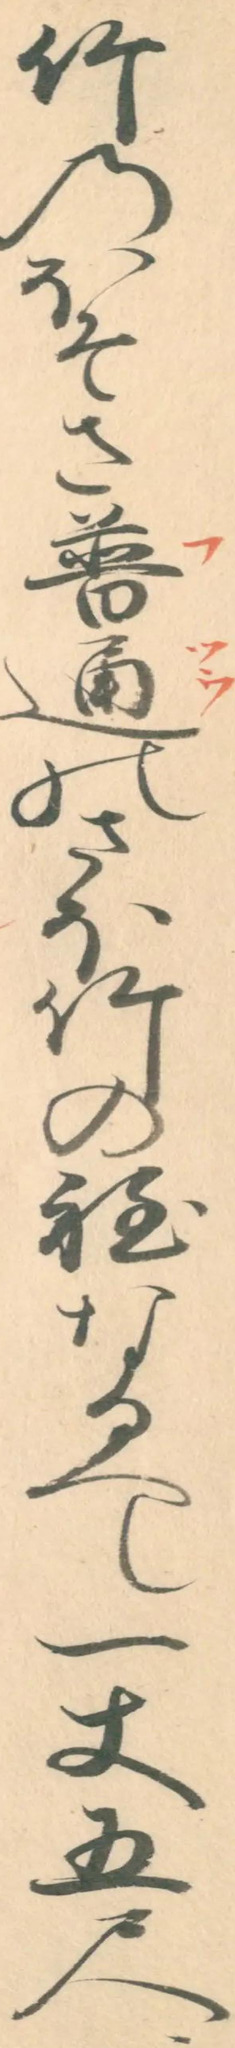竹のほそさ普通のさほ竹の程なるへし一丈五尺に
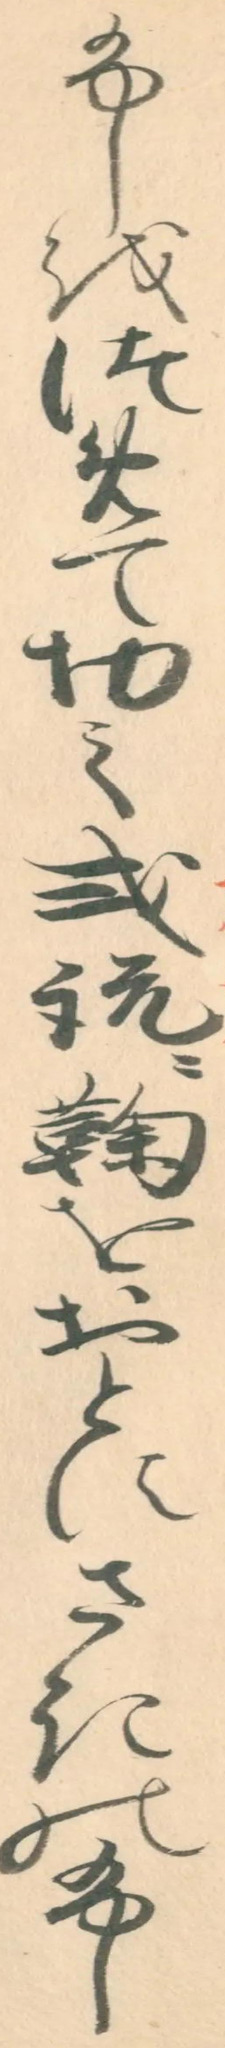ふしをつめて切之或説に鞠をおとすさきのふし
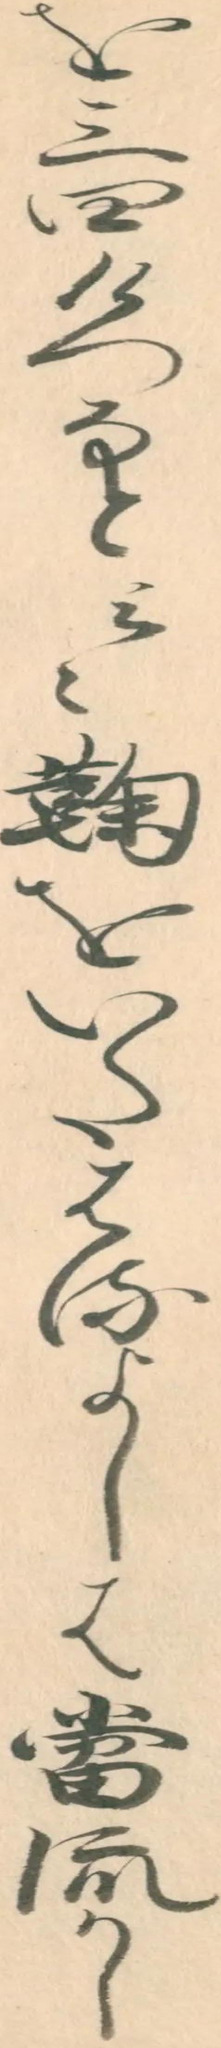を三四けつると云々鞠をいたはるよしは當流かし
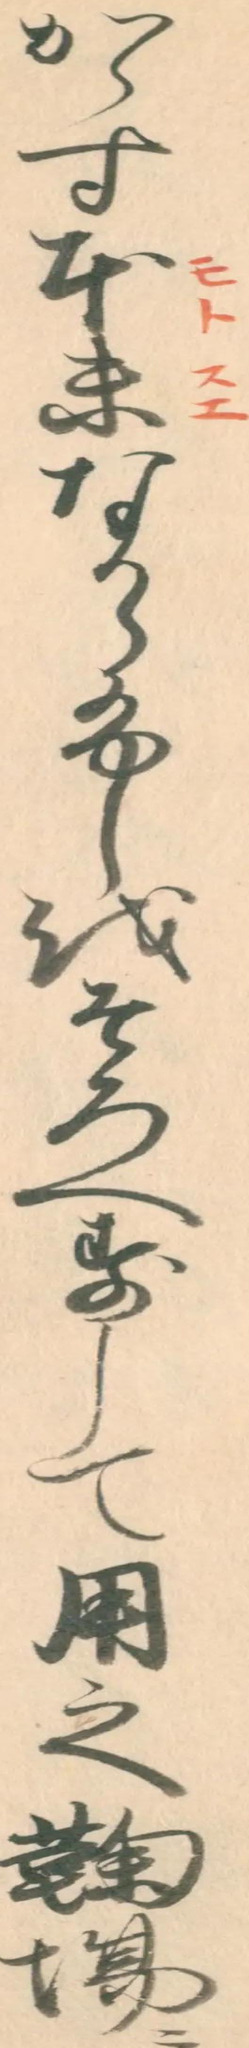からす本末なからふしをそろへすして用之鞠場に
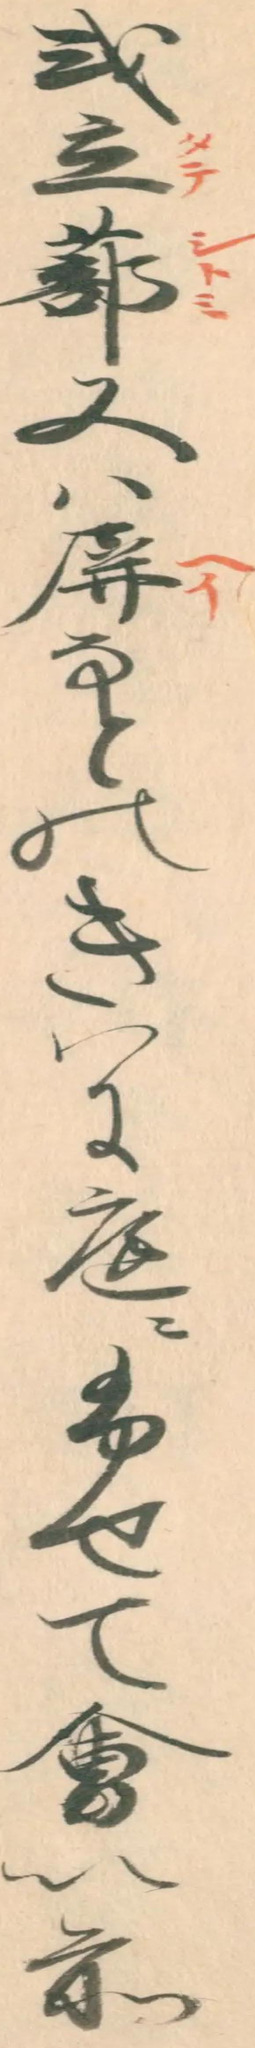或立蔀又は屏なとのきはに庭にふせて會以前
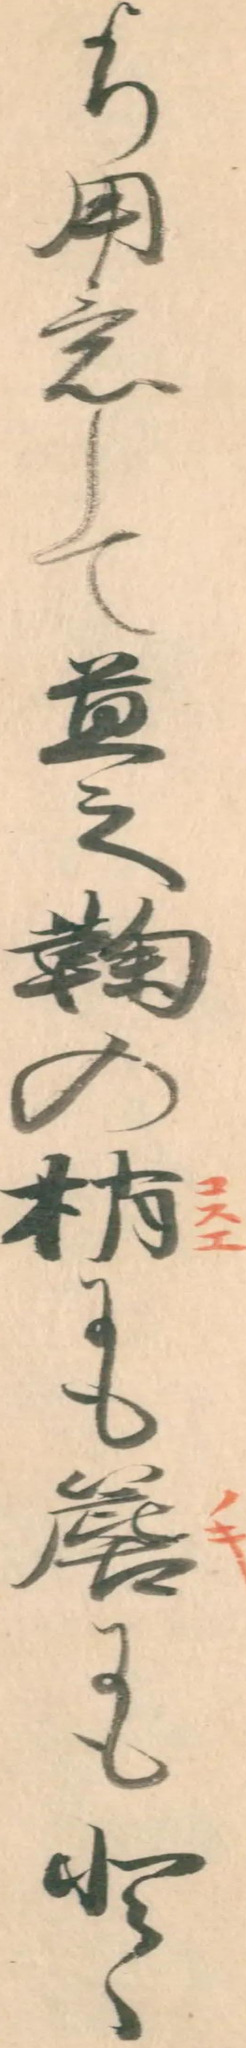より用意して並之鞠の梢にも簷にもとゝ
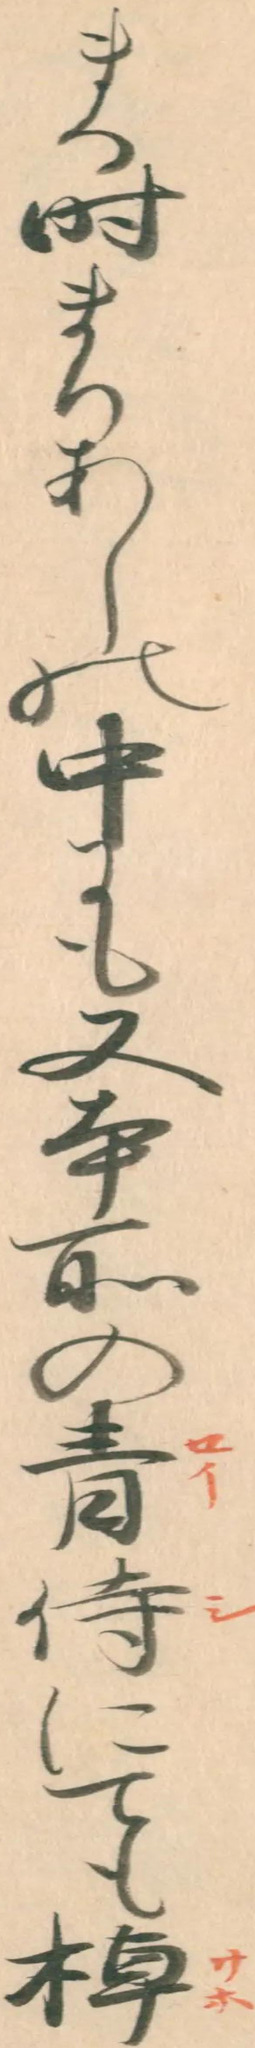まる時まりあしの中にも又本所の青侍にても棹
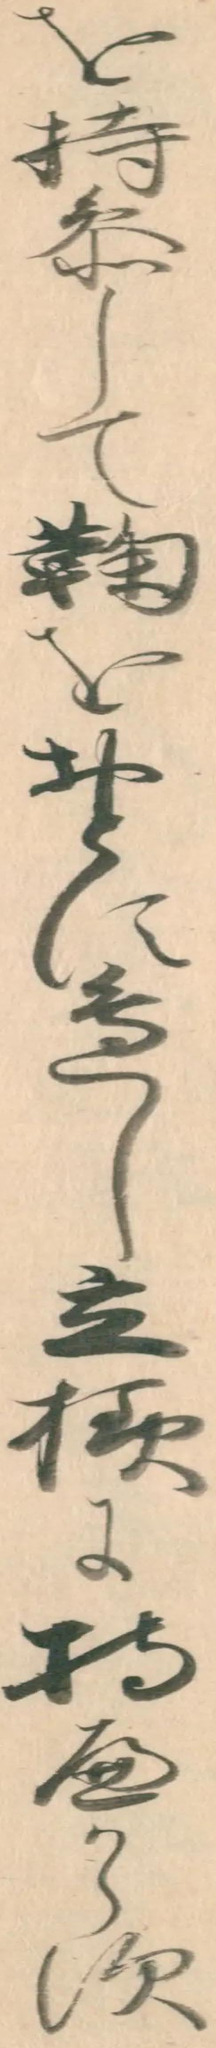を持参して鞠をおとすへし立様に持へからす
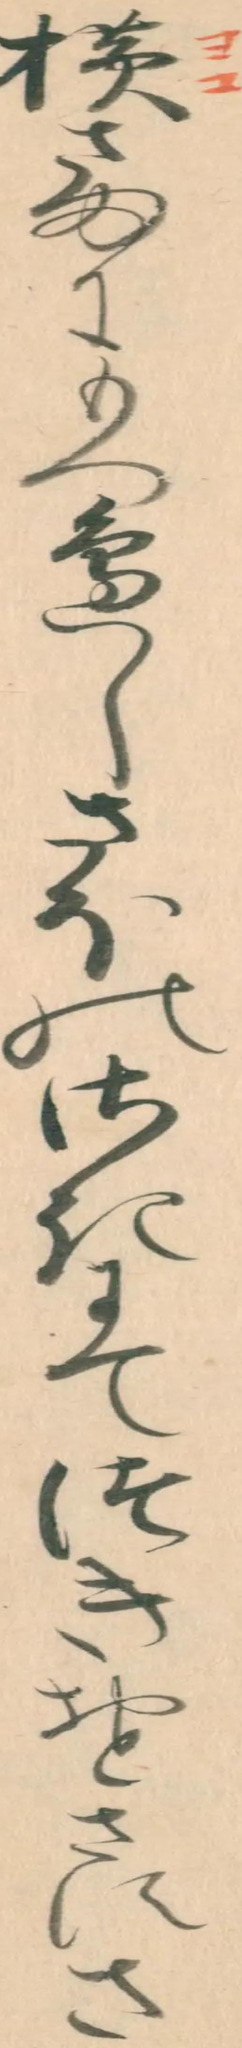横さまにもつへしさほのさきにてつきおとさすさ
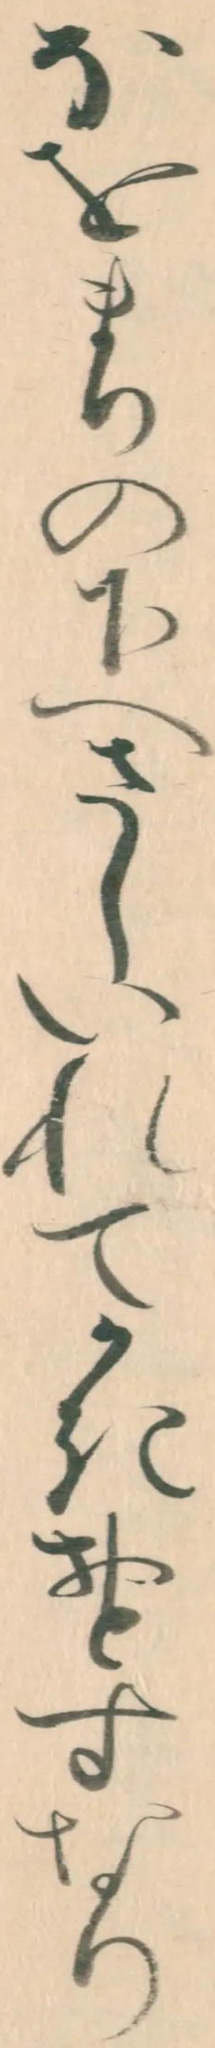ほをまりの下へさしいれてかきおとすなり
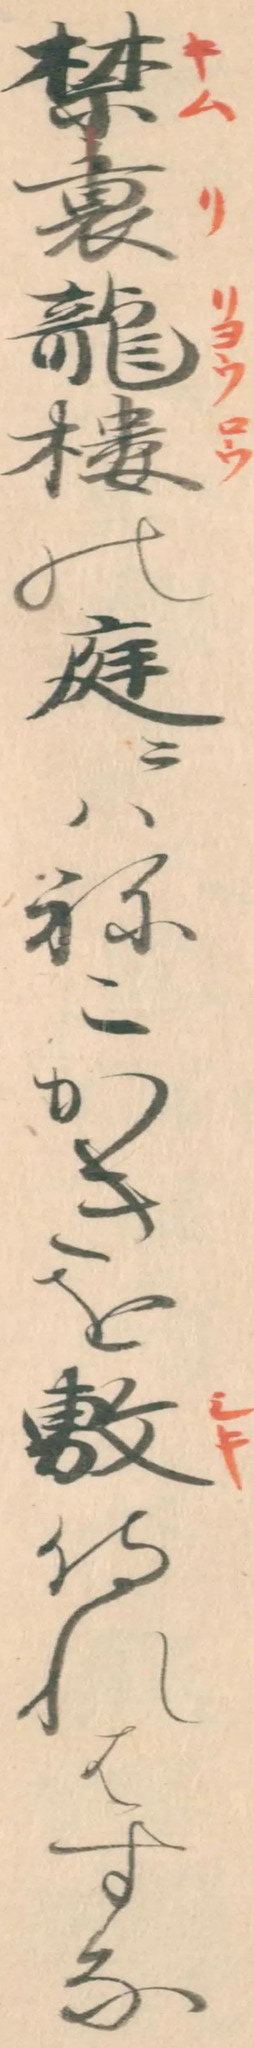禁裏龍棲の庭にはねこかきを敷侍れはすな
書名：遊庭秘抄 2巻. [1]
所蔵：国立国会図書館 National Diet Library, JAPAN
